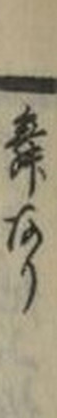舞あり
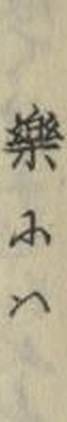楽には
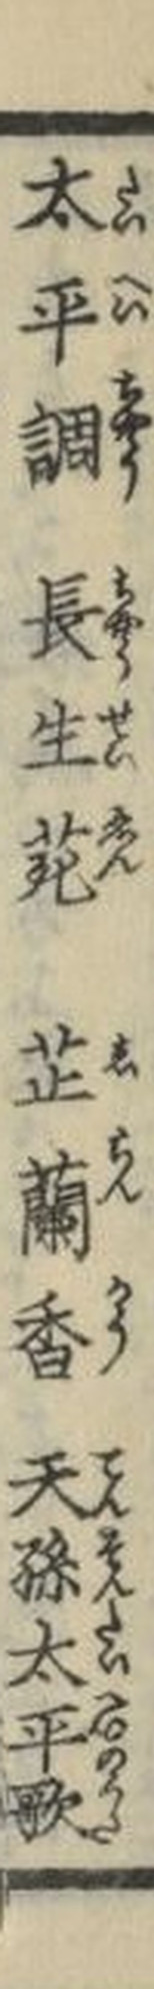太平調長生苑芷蘭香天孫太平歌
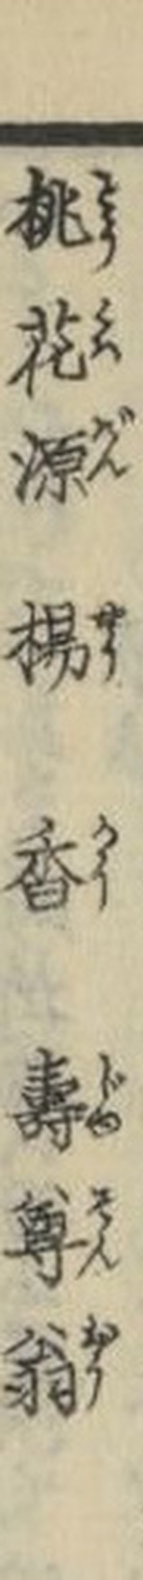桃花源楊香寿尊翁
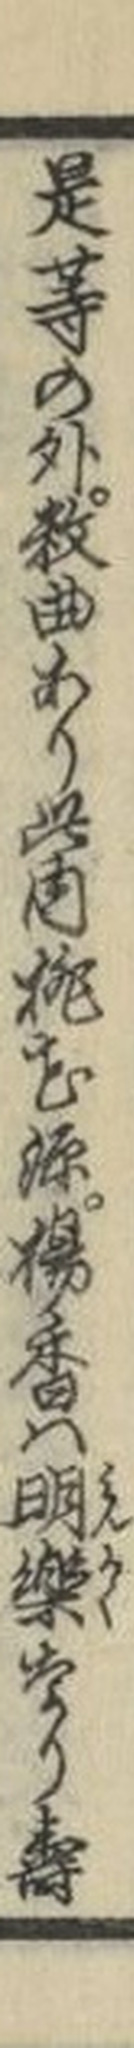是等の外。数曲あり此内桃花源。楊香は明楽なり寿
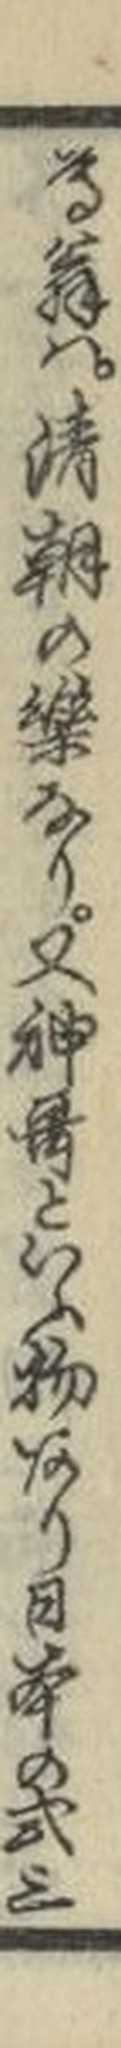尊翁は。清朝の楽なり。又神哥といふ物あり日本の式三
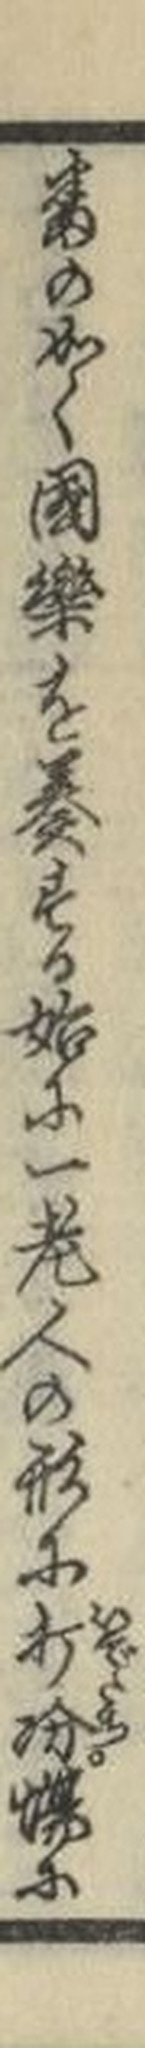番の如く国楽を奏する始に一老人の形に打扮。場に
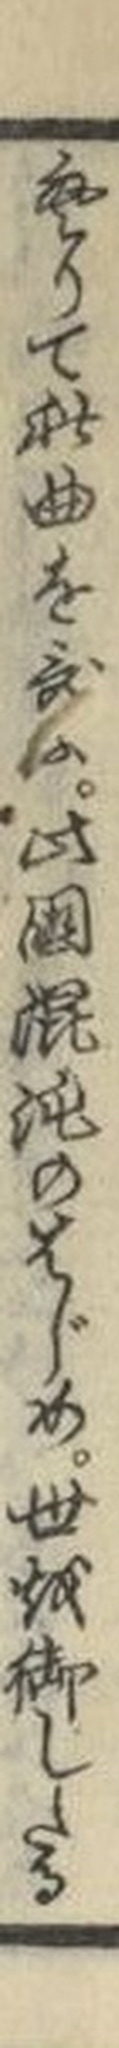登りて此曲を舞ふ。此国混沌のはじめ。世を御したる
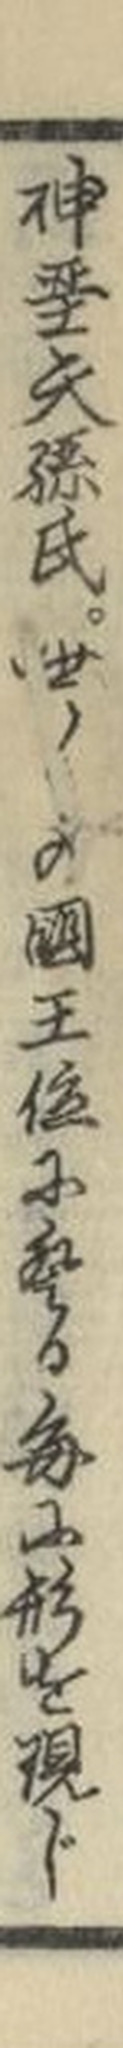神垩天孫氏。世〳〵の国王位に登る毎に形を現じ
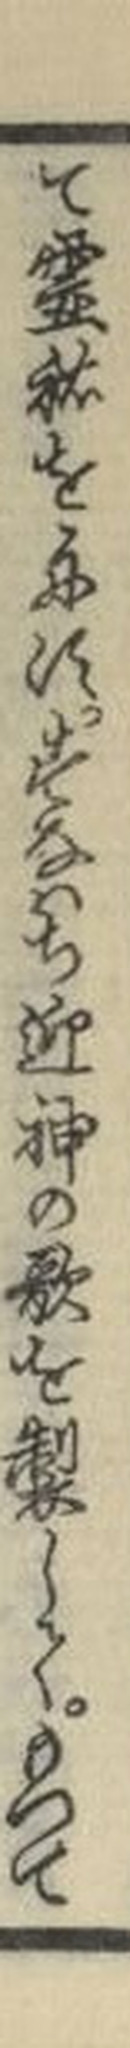て霊祐を示す。すなはち迎神の歌を製して。もつて
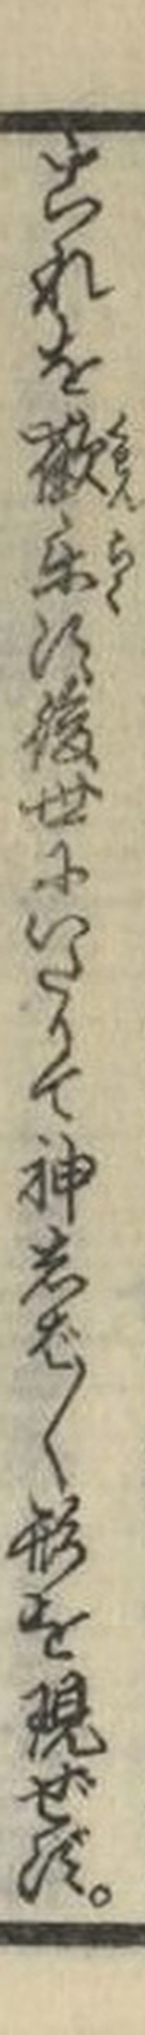これを歓楽す後世にいたりて神しば〳〵形を現ぜず。
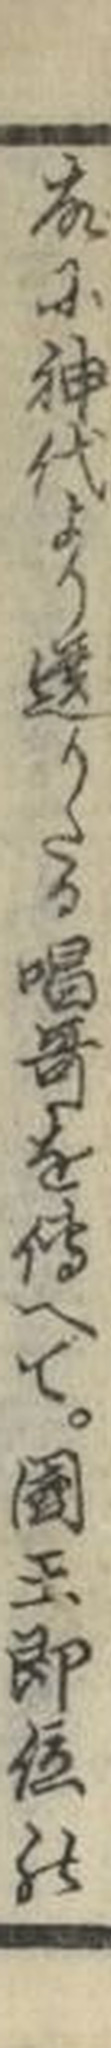故に神代より送りたる唱哥を伝へて。国王即位の
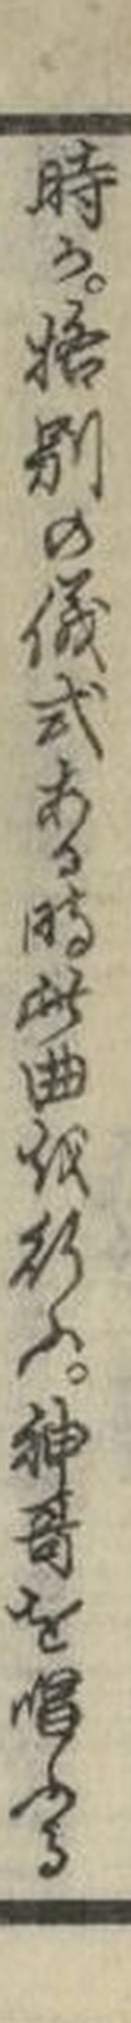時か。格別の儀式ある時此曲を行ふ。神哥を唱ふる
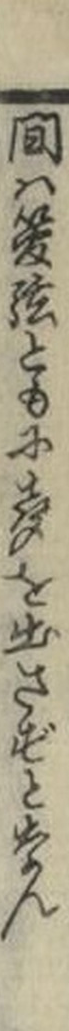間は管弦ともに声を出さずとなん
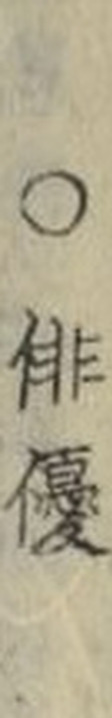○俳優
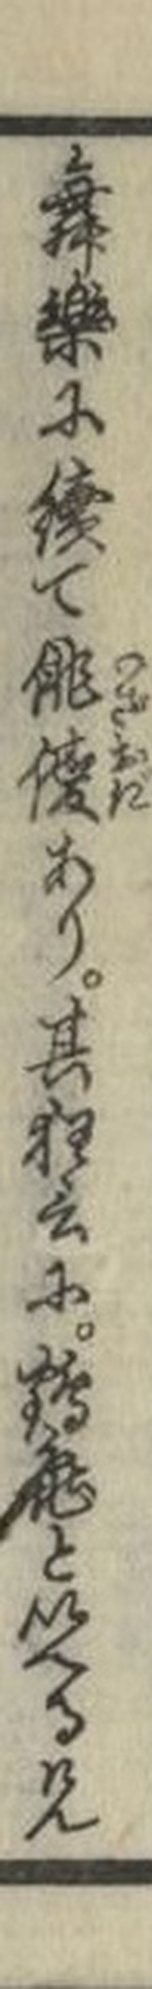舞楽に続て俳優あり。其狂言に。鶴亀といへる兄
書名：琉球解語
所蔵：University of the Ryukyus Library
